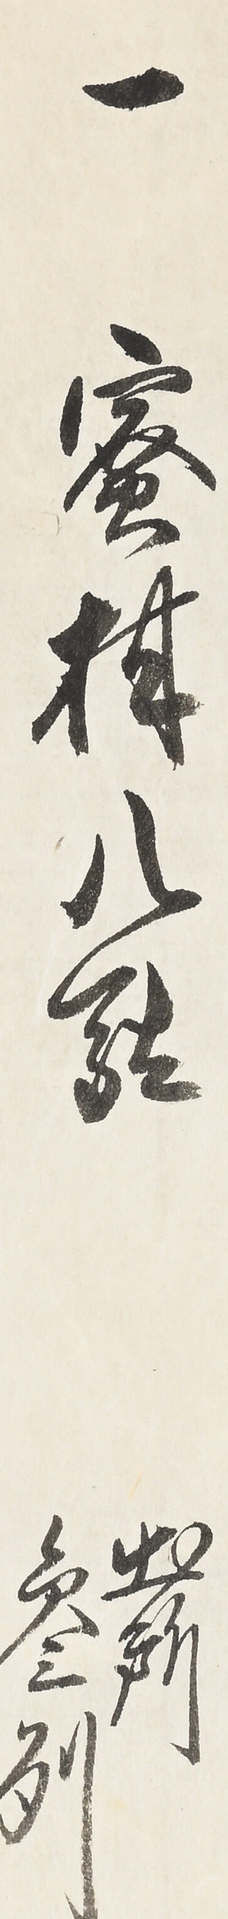一蜜柑八駄出所
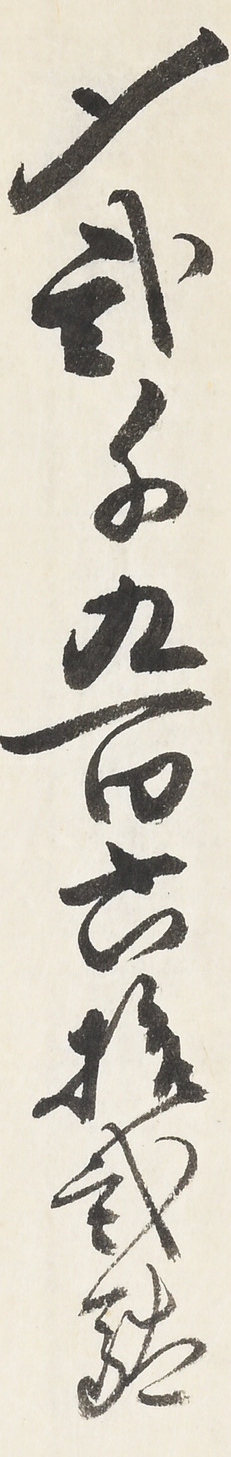〆弐千九百六拾弐駄
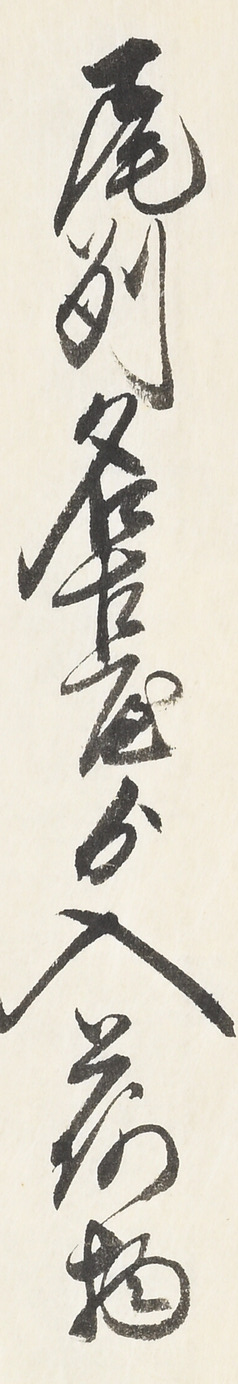尾州名古屋ゟ入荷物
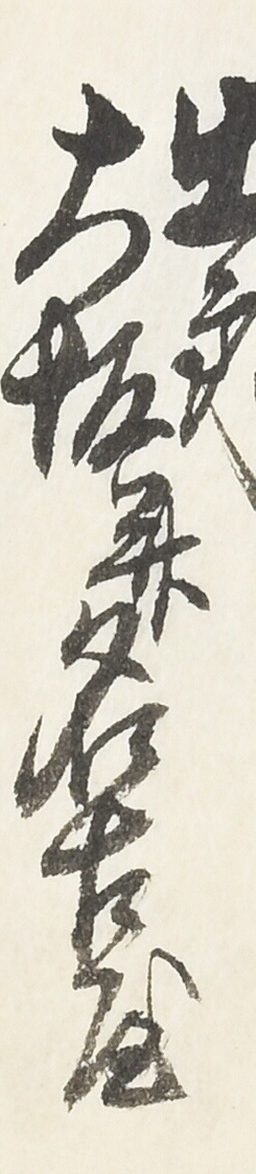大坂并名古屋
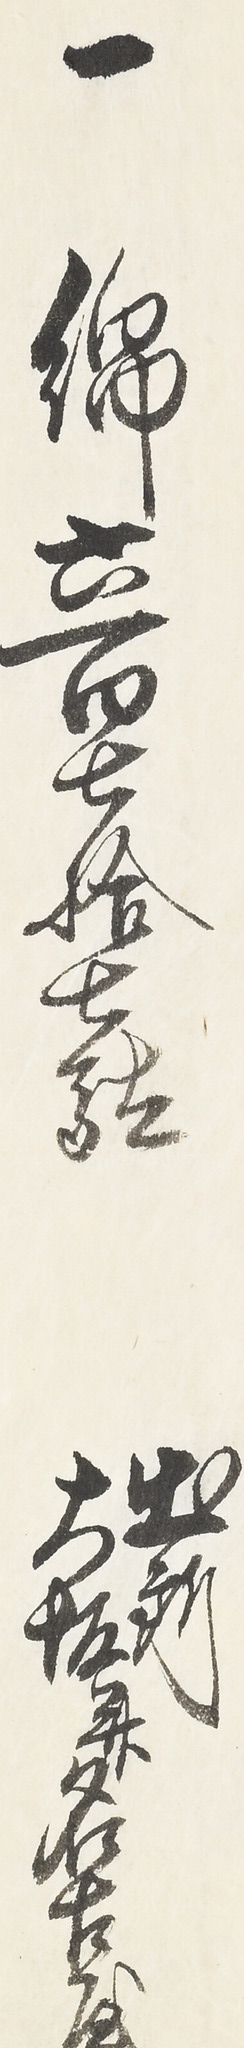一綿六百七拾七駄出所
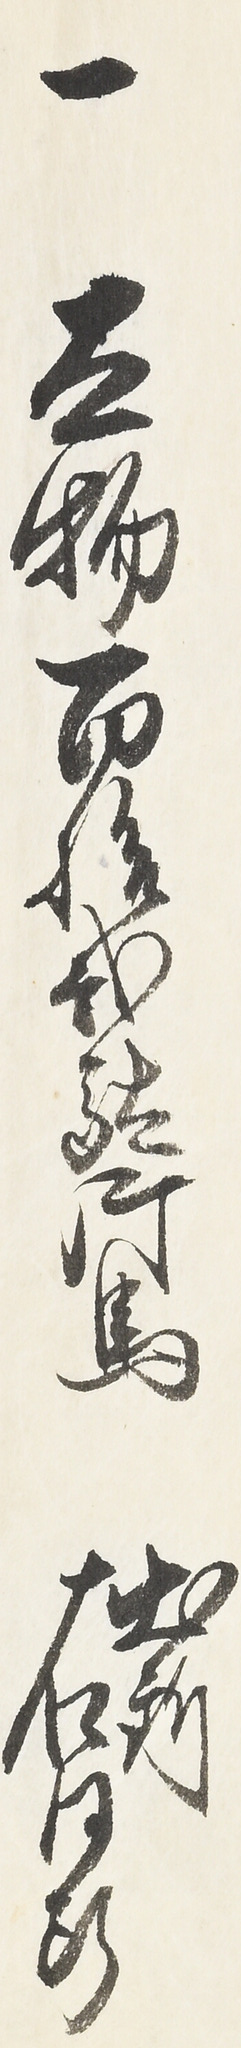一太物百拾弐駄片馬出所
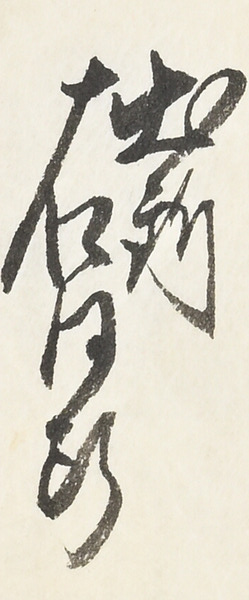右同断
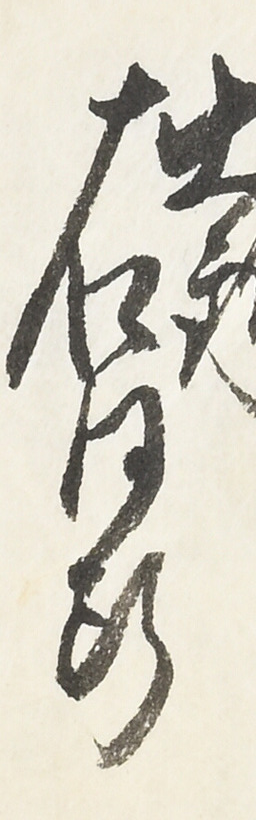右同断
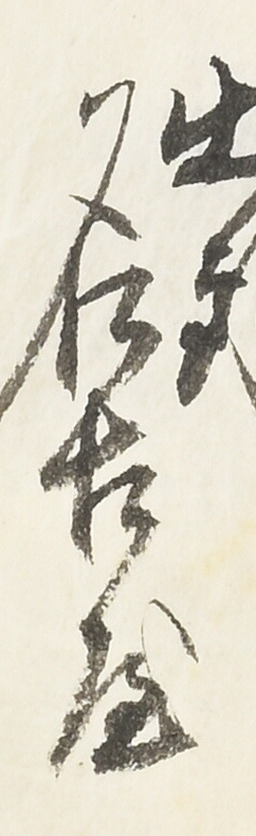名古屋
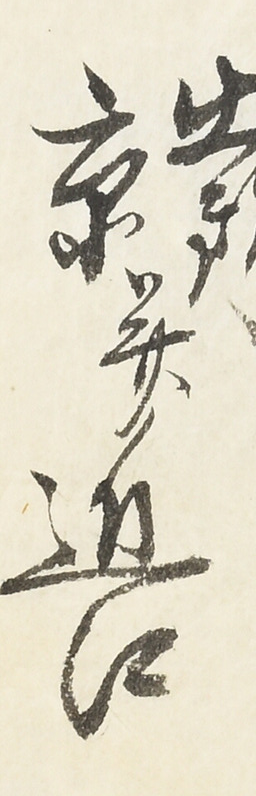京并近江

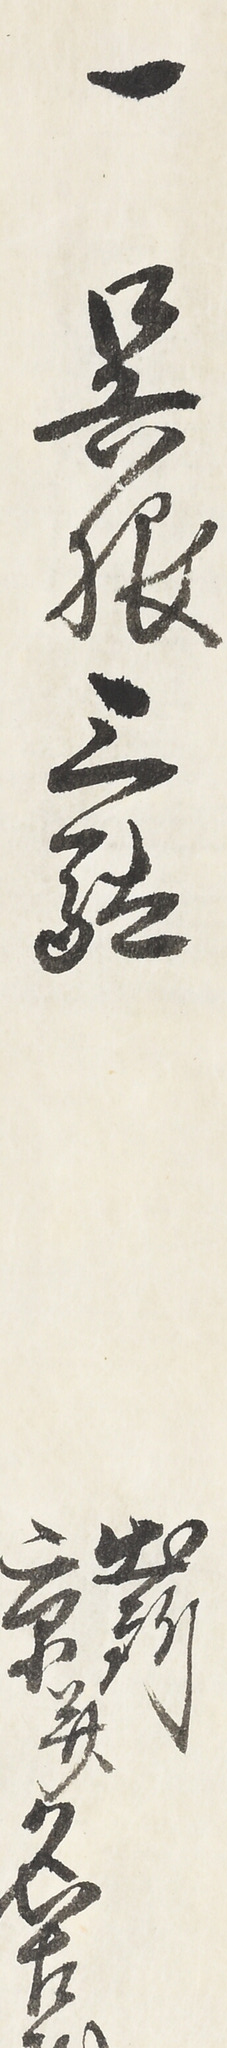一呉服三駄出所
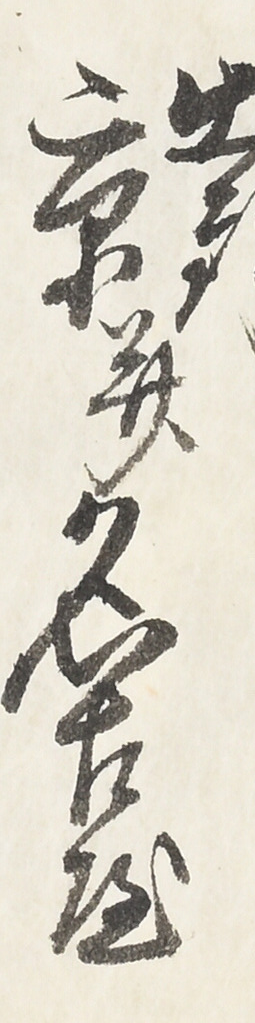京并名古屋
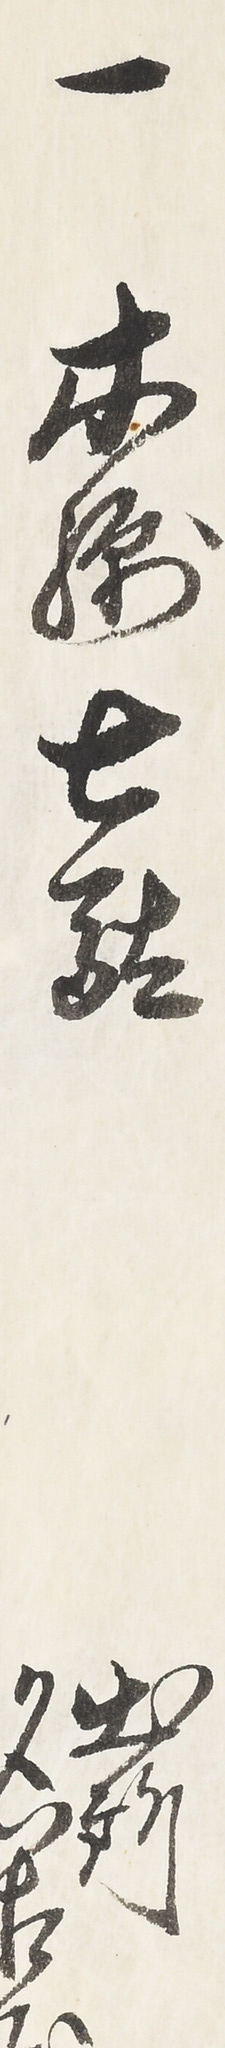一木綿七駄出所
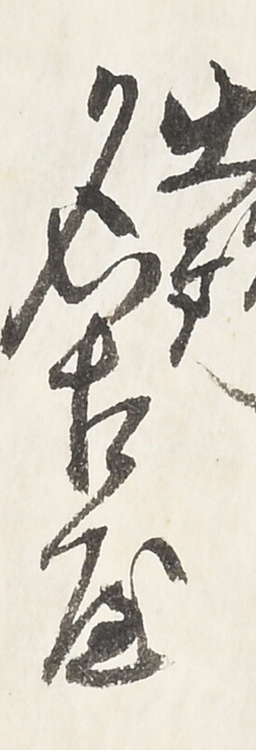名古屋
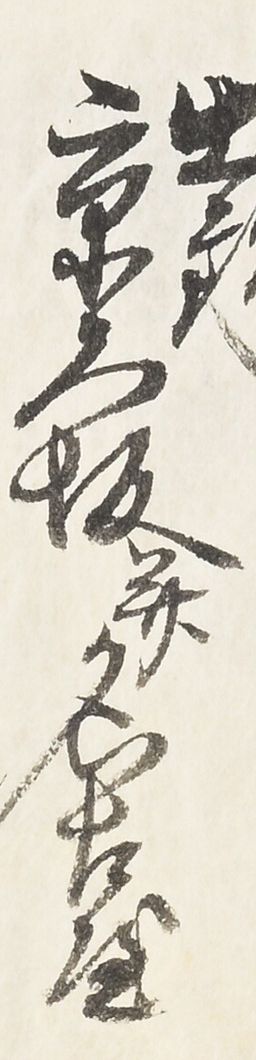京大坂并名古屋
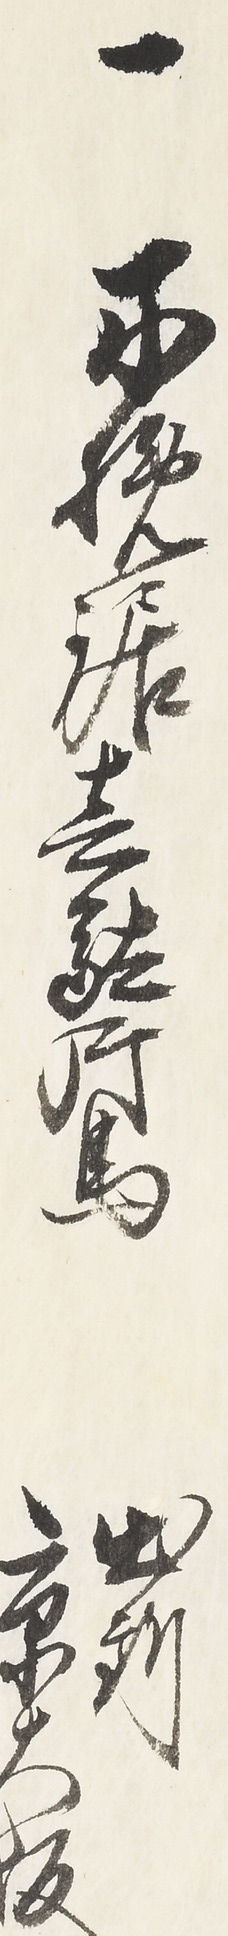一木挽鋸壱駄片馬出所
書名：中馬ニテ附通候出入荷物目録帳
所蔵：伊那市立高遠町図書館・合同会社AMANE
